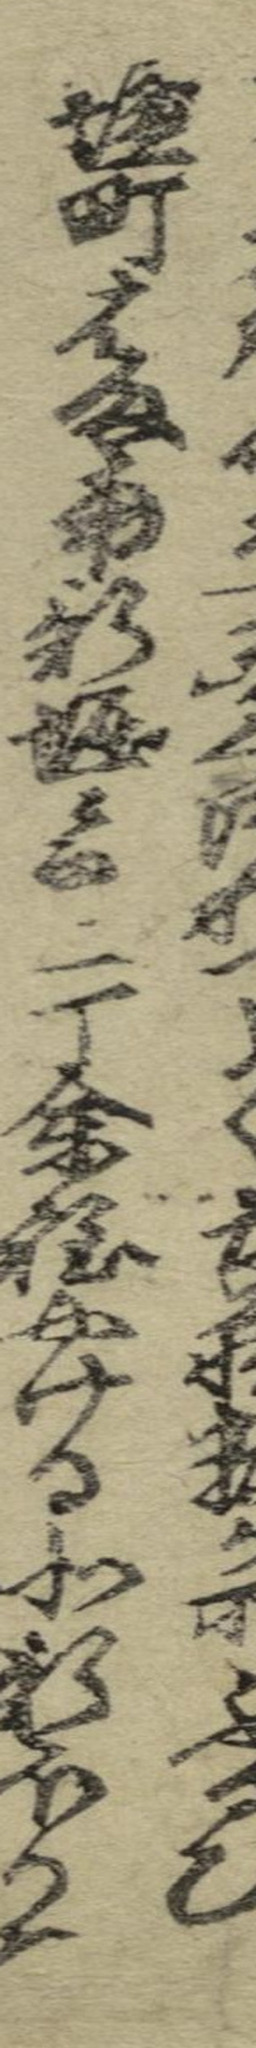堀町はた南新堀ニ而二丁余程やける北新ほりは
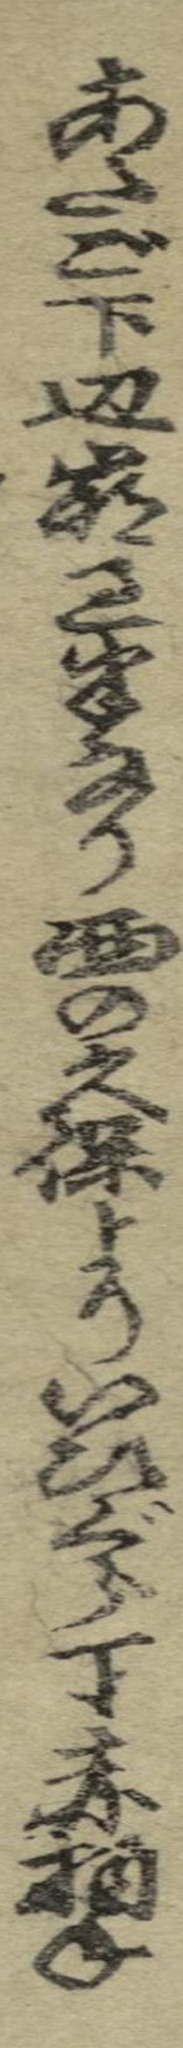あたご丁辺崩過半なり西の久保よりいひぐら町赤羽手
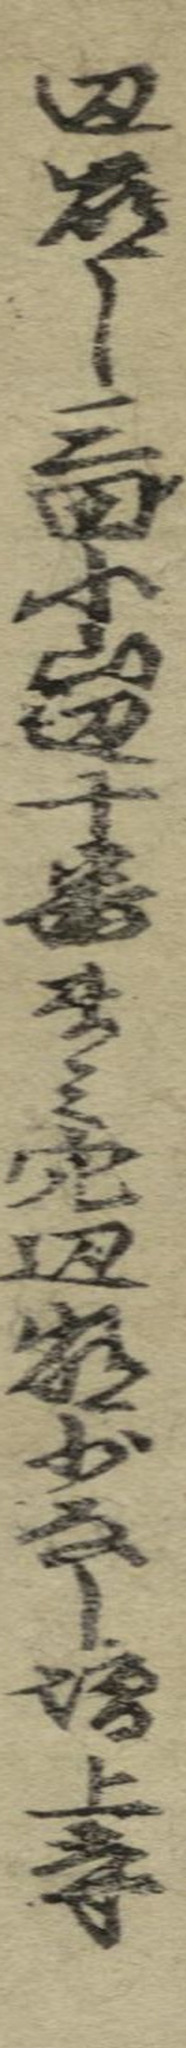辺崩し三田小山辺十番まみ穴辺崩少なし増上寺
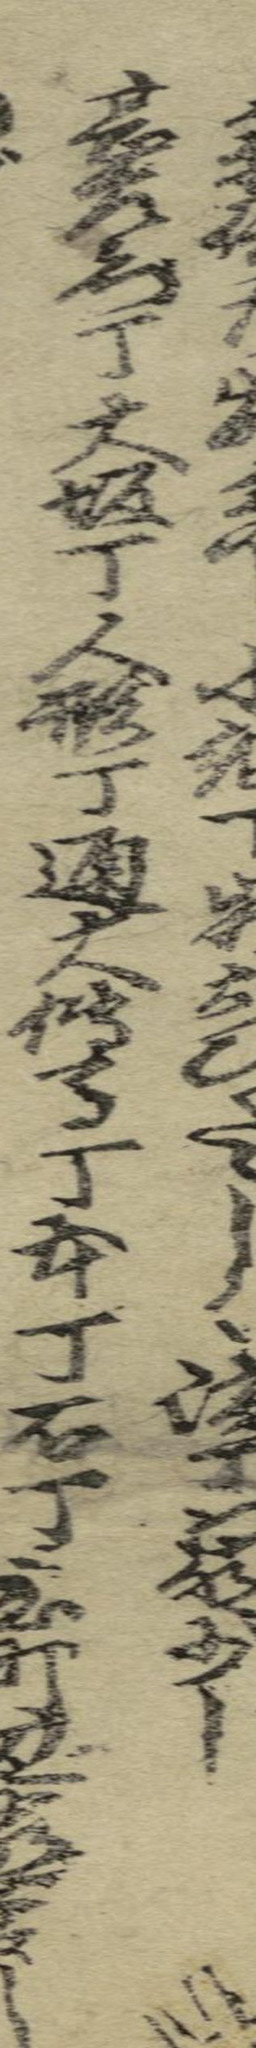甚左衛門丁大坂丁人形丁通大伝馬丁本丁石丁室町辺崩多し
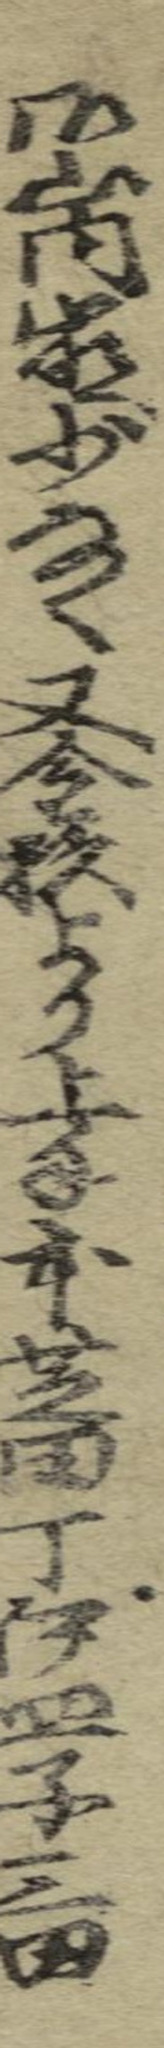御山内崩少なく又金杉より上手本芝田丁伊皿子三田
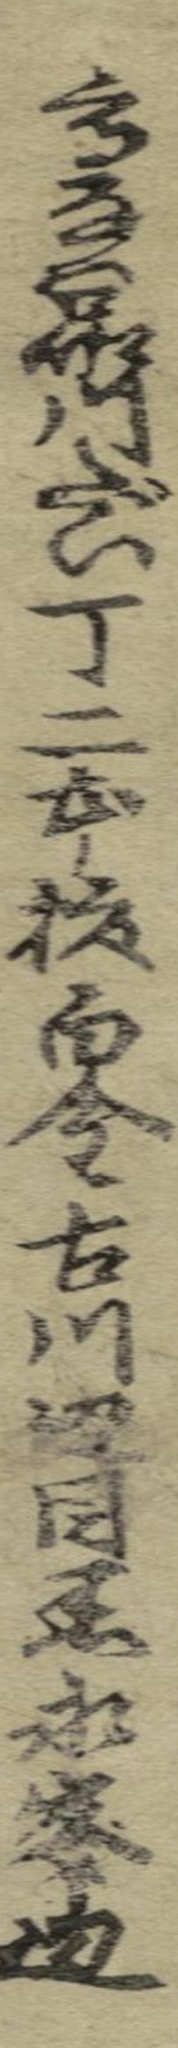高輪品川だい丁二本榎白金古川辺目黒永峯辺
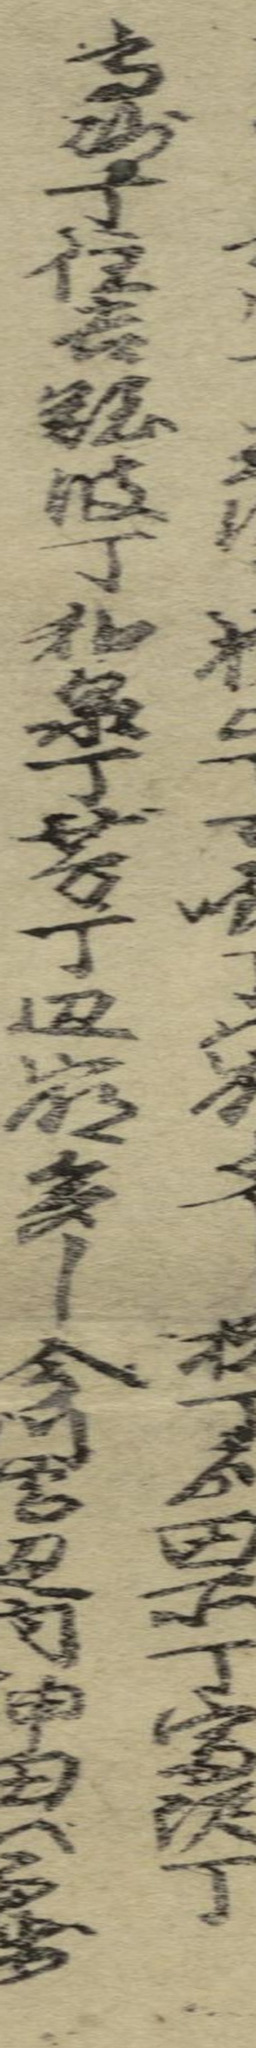高砂丁住吉難波丁和泉丁芳丁辺崩多し今川橋辺内神田は不残
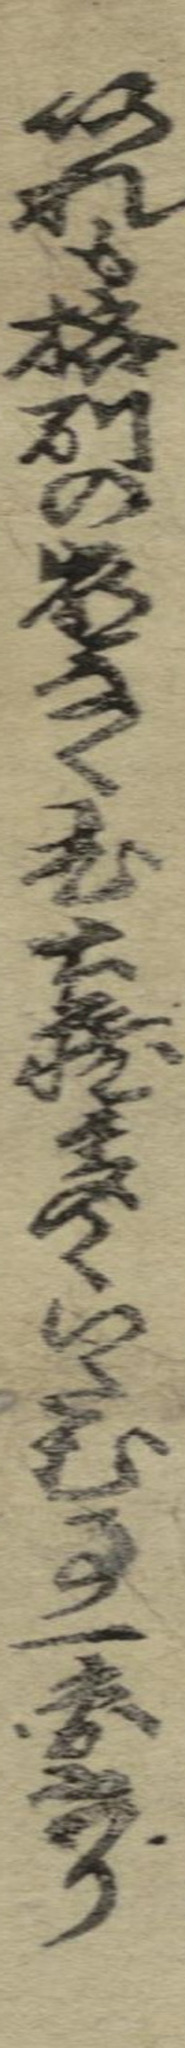何れも格別の崩なく尤土蔵多くいたむ事一円なり
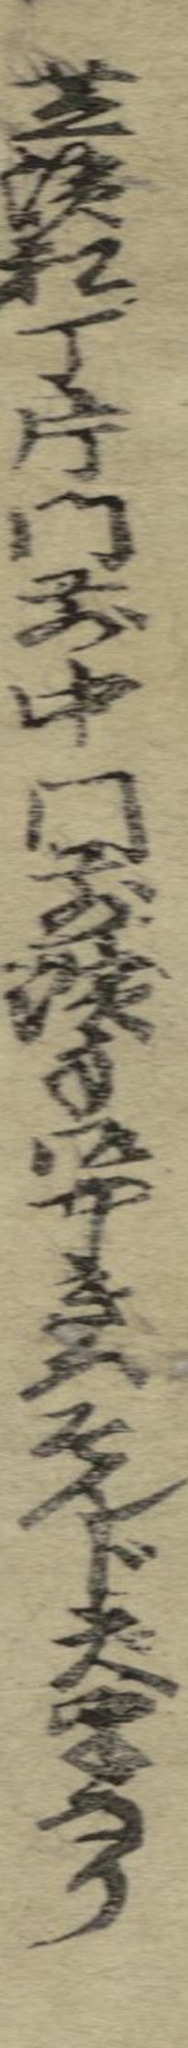芝濱松丁片門前中門前浜手御やしきはそんじ大半なり
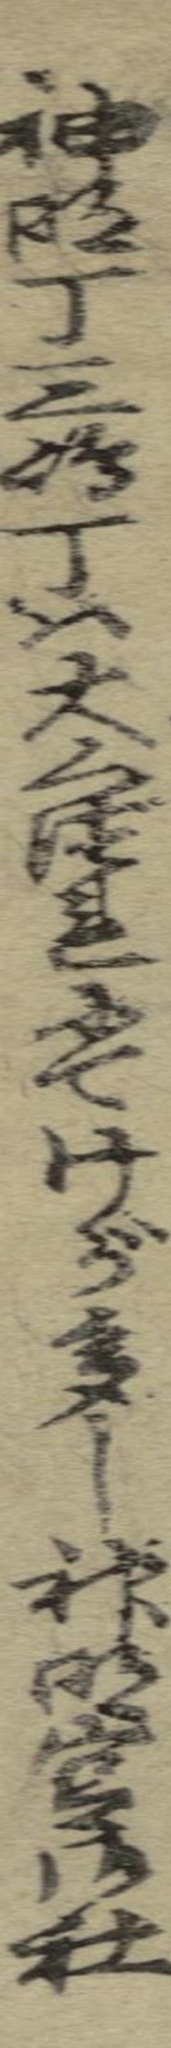神明丁三嶋丁は大くつれにてけが多し神明宮御社
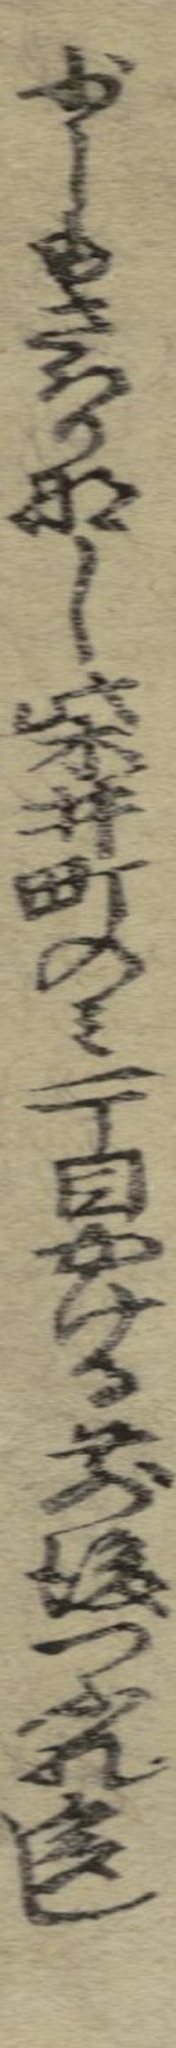少しもさはりなし柴井町のみ一丁目やける前後つぶれ多し
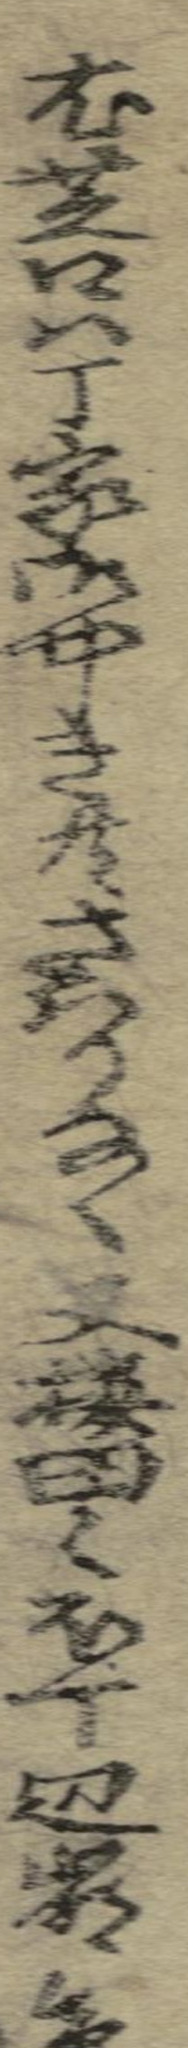尤芝口は丁家御やしき共さはりなく又桜田くほ丁辺崩多し
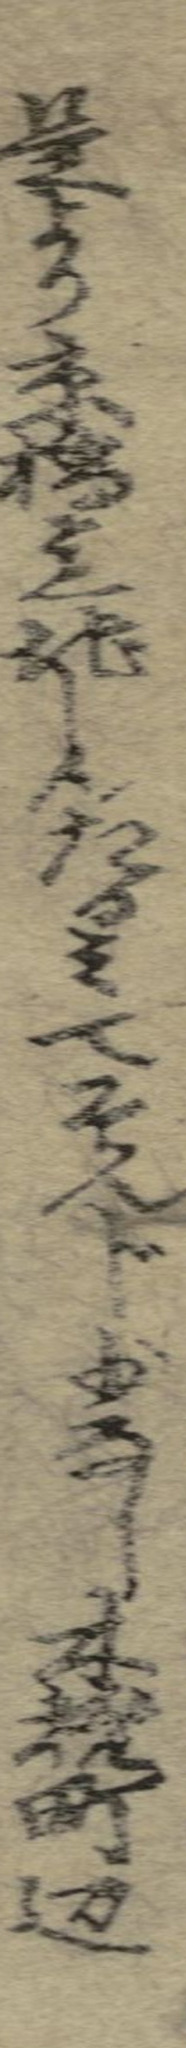是より京橋迄地表たるみてそんじ少なし木挽町辺
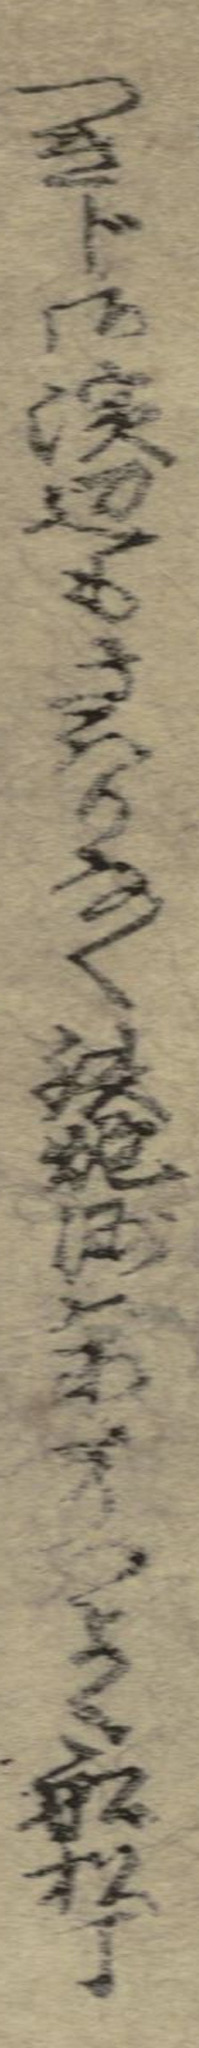つきじ御浜辺もさはりなく鉄炮洲あたりよく船松丁
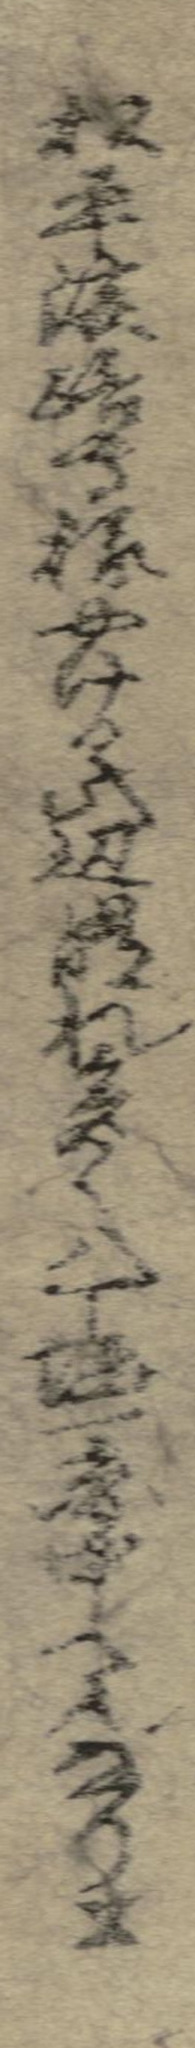松平淡路守様やける此辺崩れ多く八丁堀一円中へんなり⌛
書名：安政二年十月二日大地震并出火場所方角巨細
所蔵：東京大学地震研究所図書室 Earthquake Research Institute Library, The University of Tokyo, JAPAN
